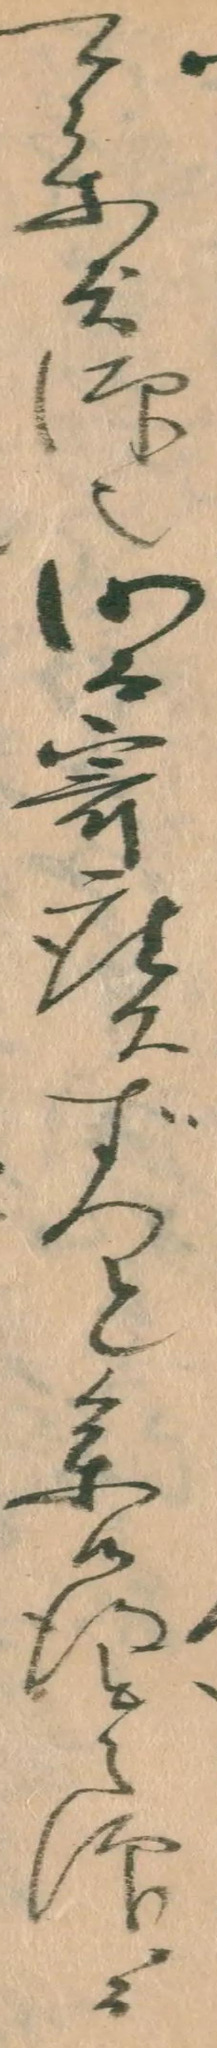可参旨仰也仍而寄座スずつと参候得と之仰ニ而
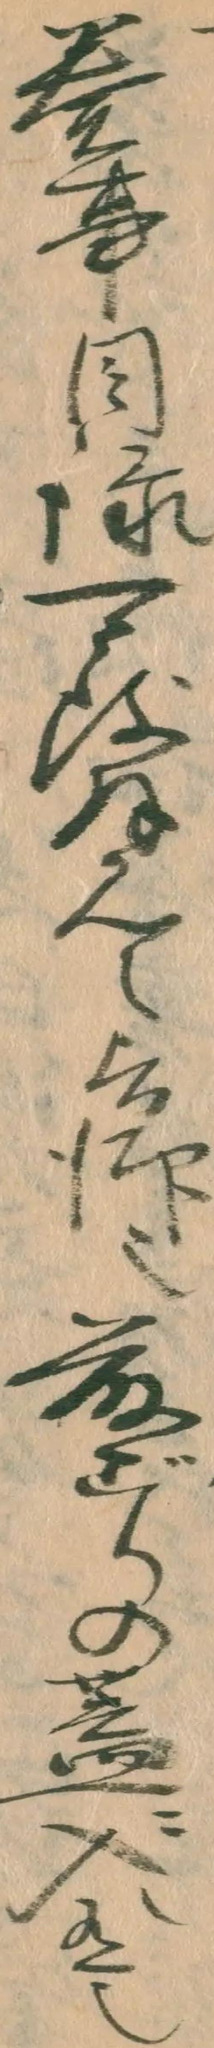奏事目録可致拝見之旨仰也藤ずりの蓋ニ入之有也
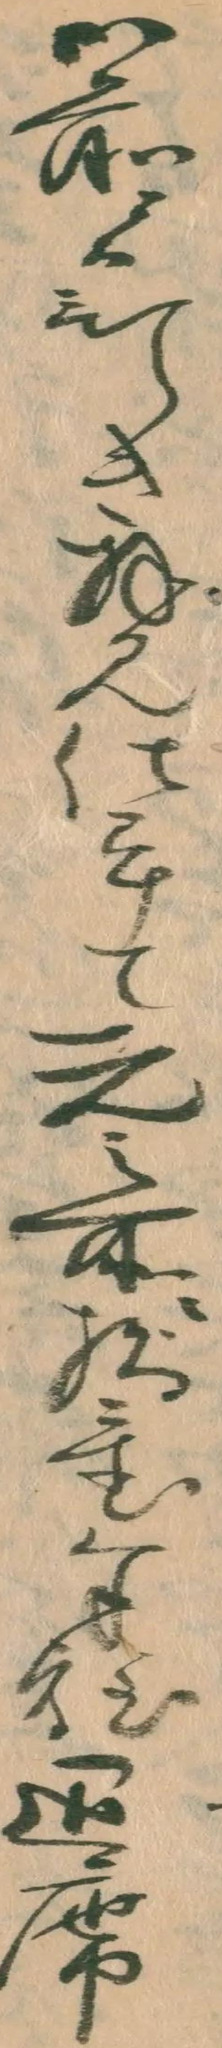御前ニ而ひらき拝見仕畢て元之所ニ指置半程退席
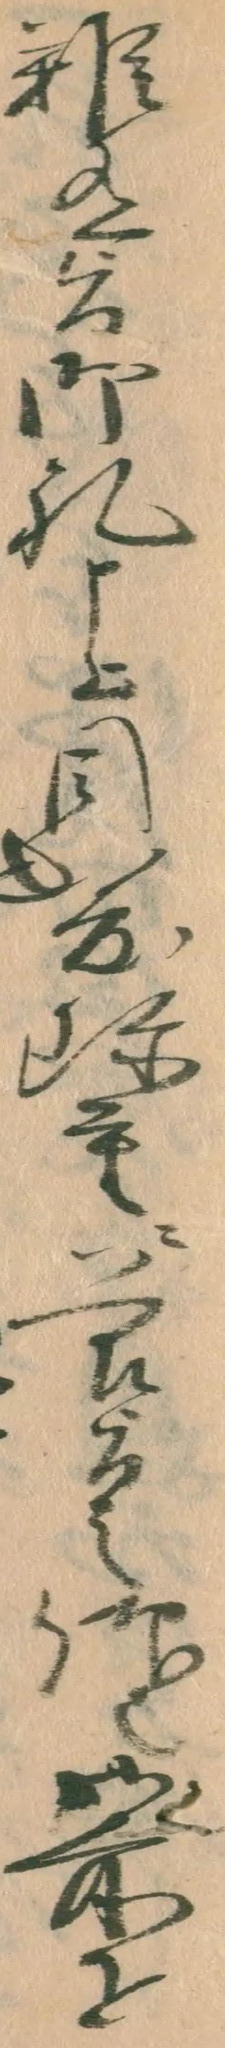難有旨御礼申上目出度珍重ニ思召旨之仰也御前を
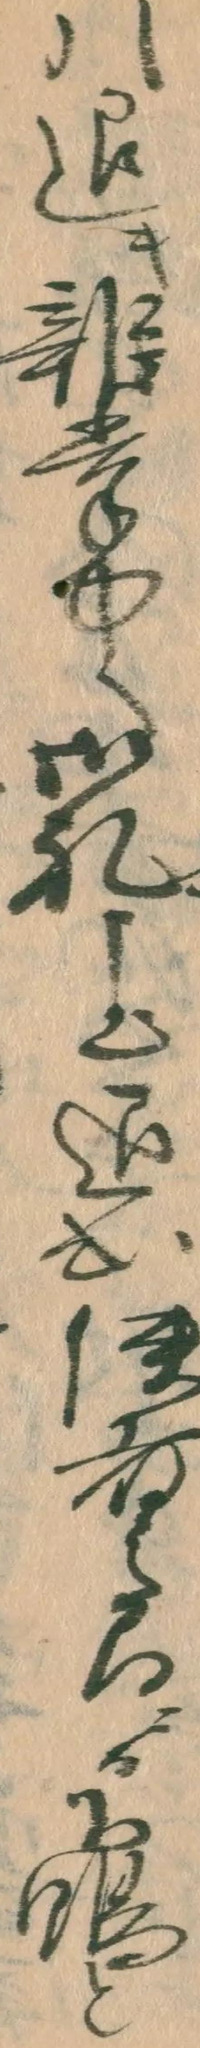引退キ雑掌中へ御礼申上退出使者之間ニ而下鴨と
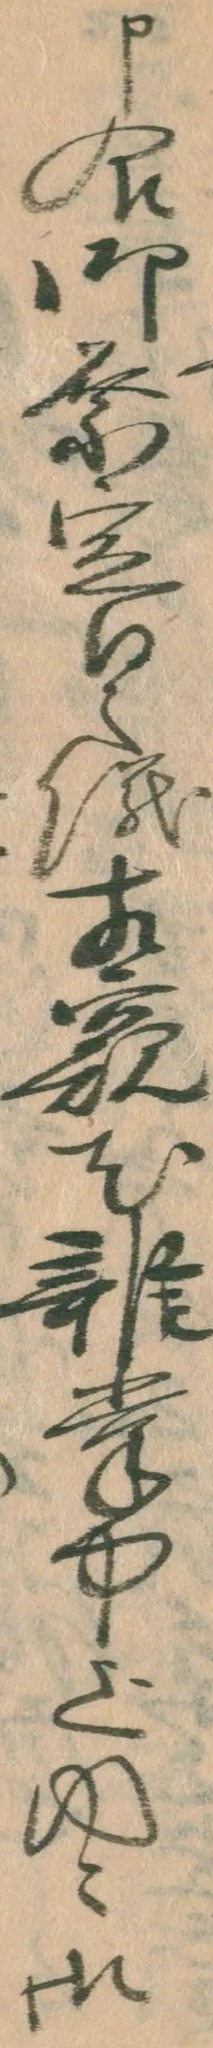申合御祭定日之儀相窺尤雑掌中迄内々御
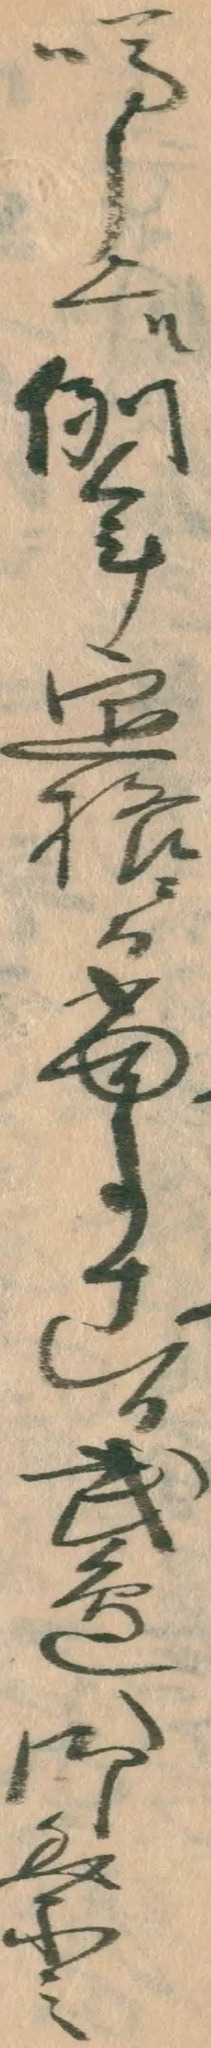噂申上ル例年定格ニ而当月十一日武辺へ御祭之
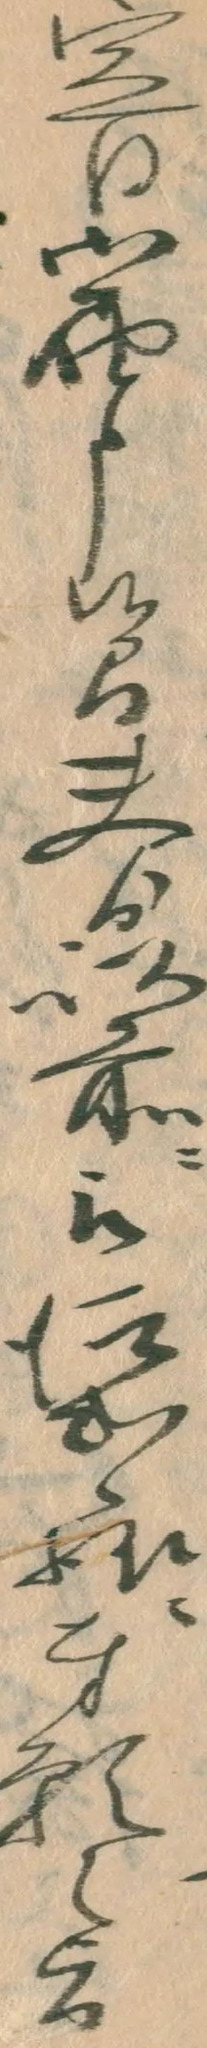定日御届申候間夫ゟ以前ニ被仰出候様ニ奉願候旨
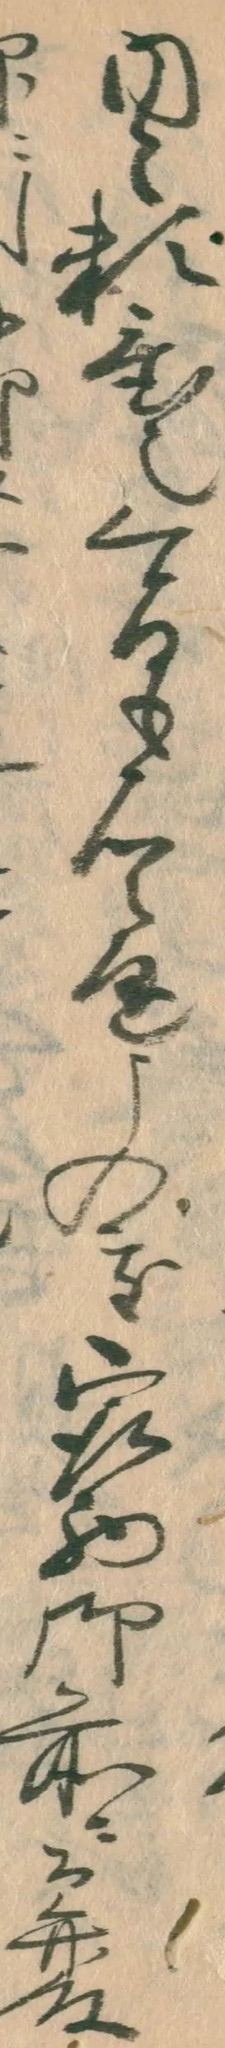内々頼置也今日も右之通申入度最初御前ニ而弁殿
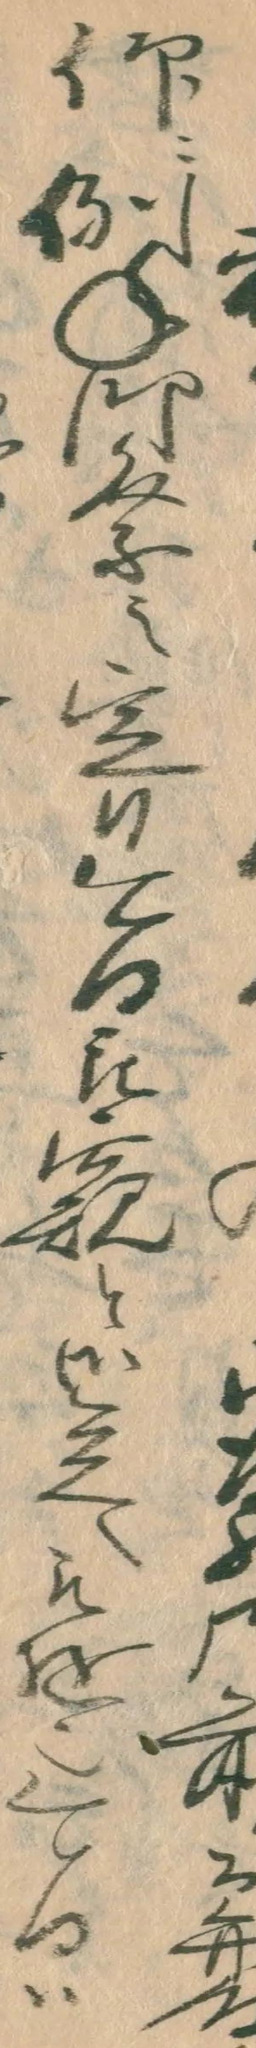仰ニ例年御祭之定日今日被窺と御覚へ被遊也今日ハ
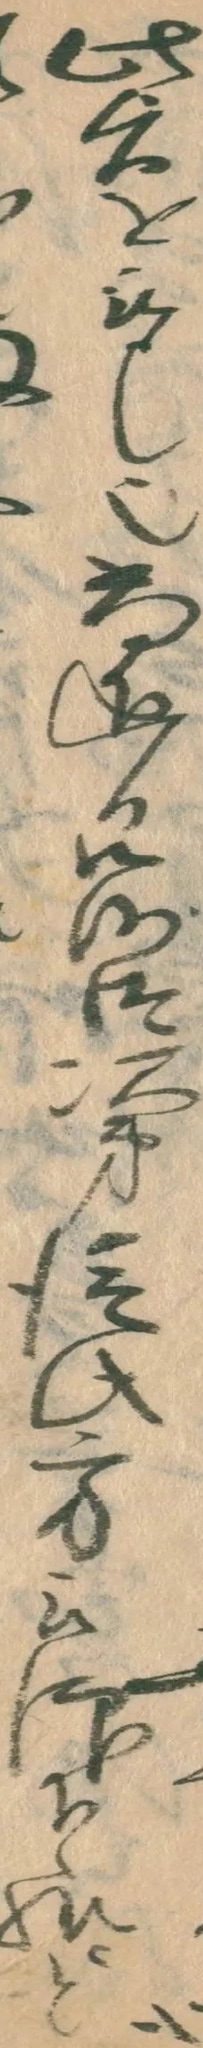此旨を被申候也尚近日御沙汰次第従此方被仰下候様ニと
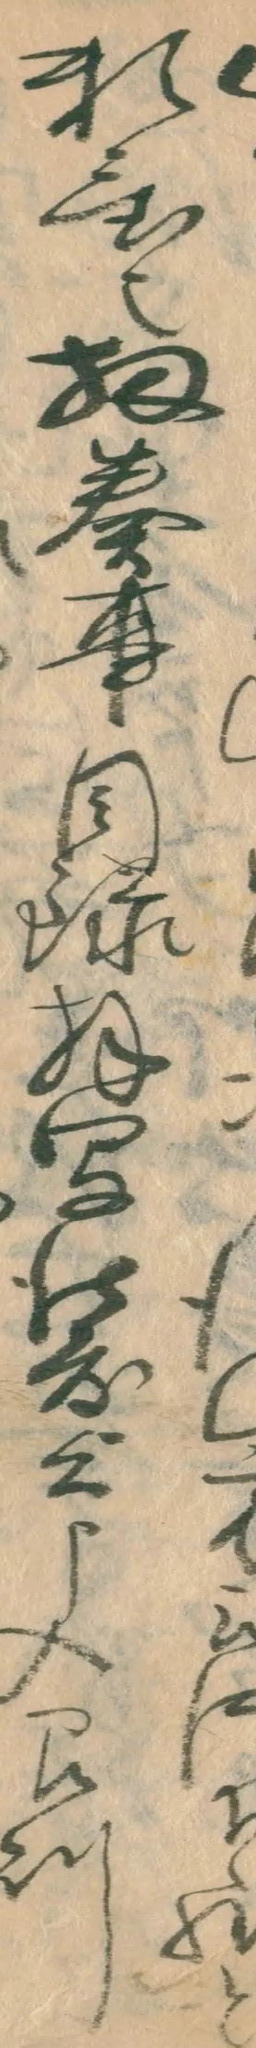頼置也扨奏事目録拝写仕度旨申入即刻

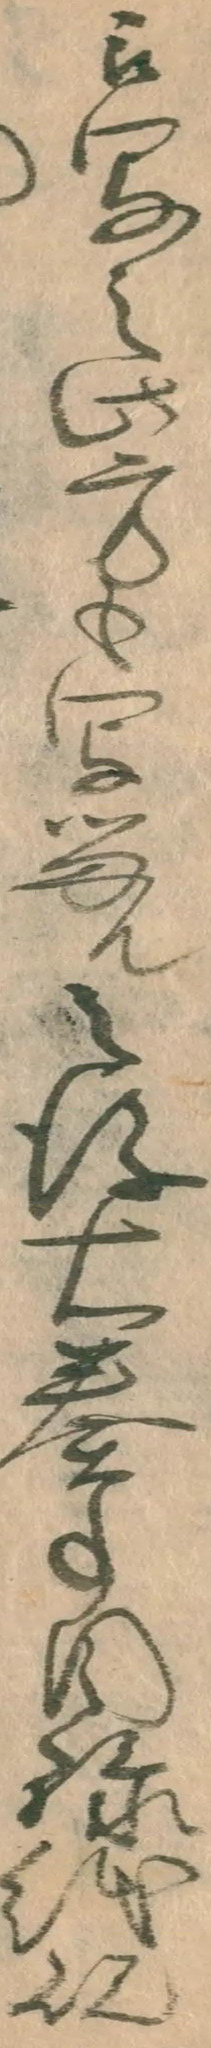被写之此方も写留ル之後右奏事目録紙硯
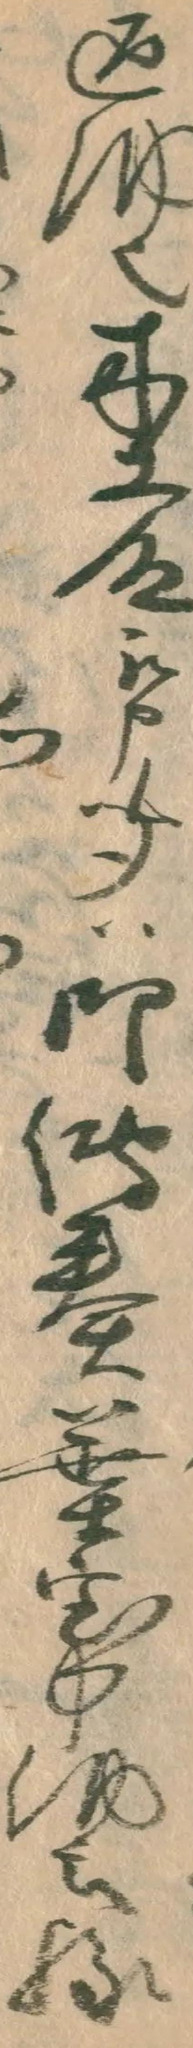返納也木工殿被申聞ハ御伝奏葉室中納言様
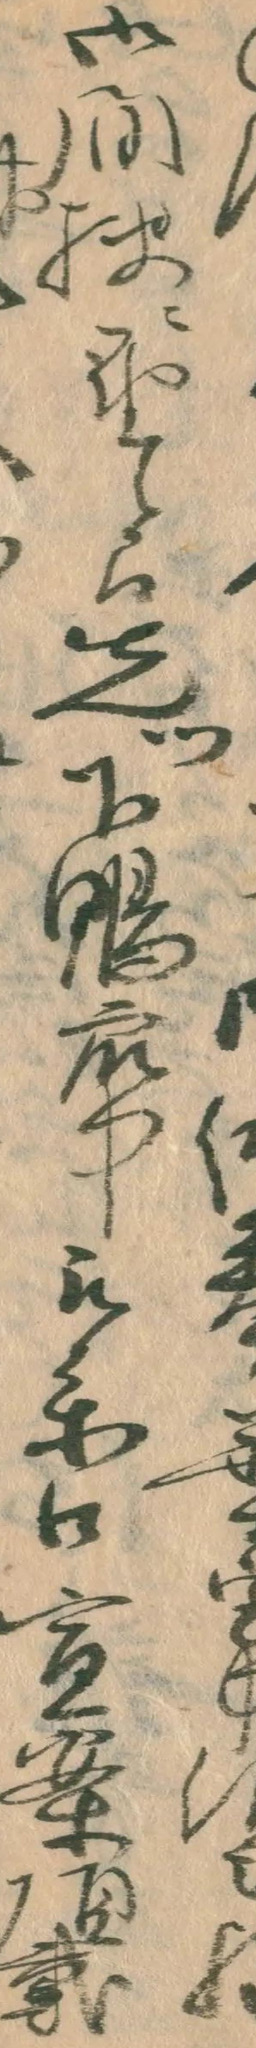御間狭ニ御座候間先ツ下鴨衆中被参口宣案頂戴
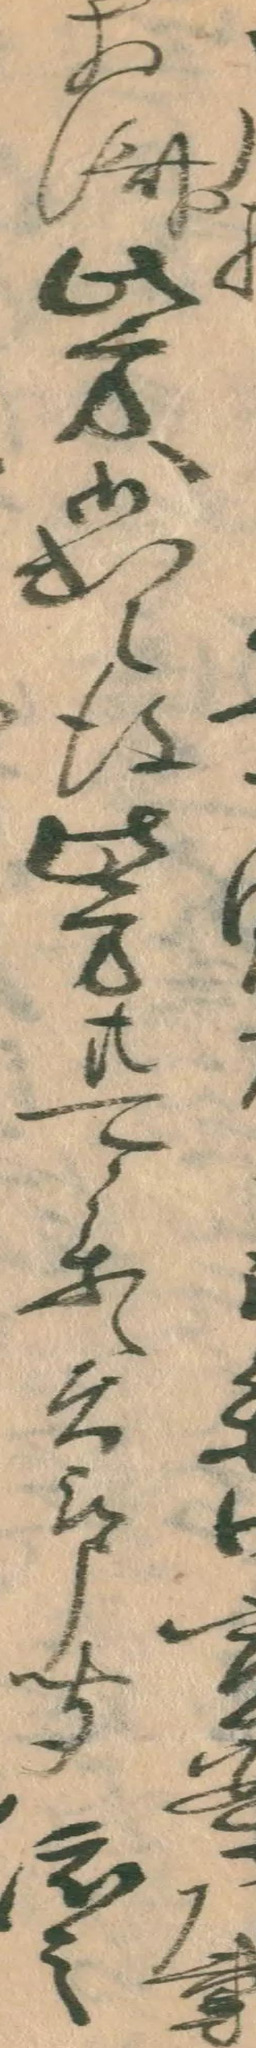相済此方へ御出候後此方共可参候旨被申聞依之
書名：賀茂社記録. 第60冊
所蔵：国立国会図書館 National Diet Library, JAPAN
